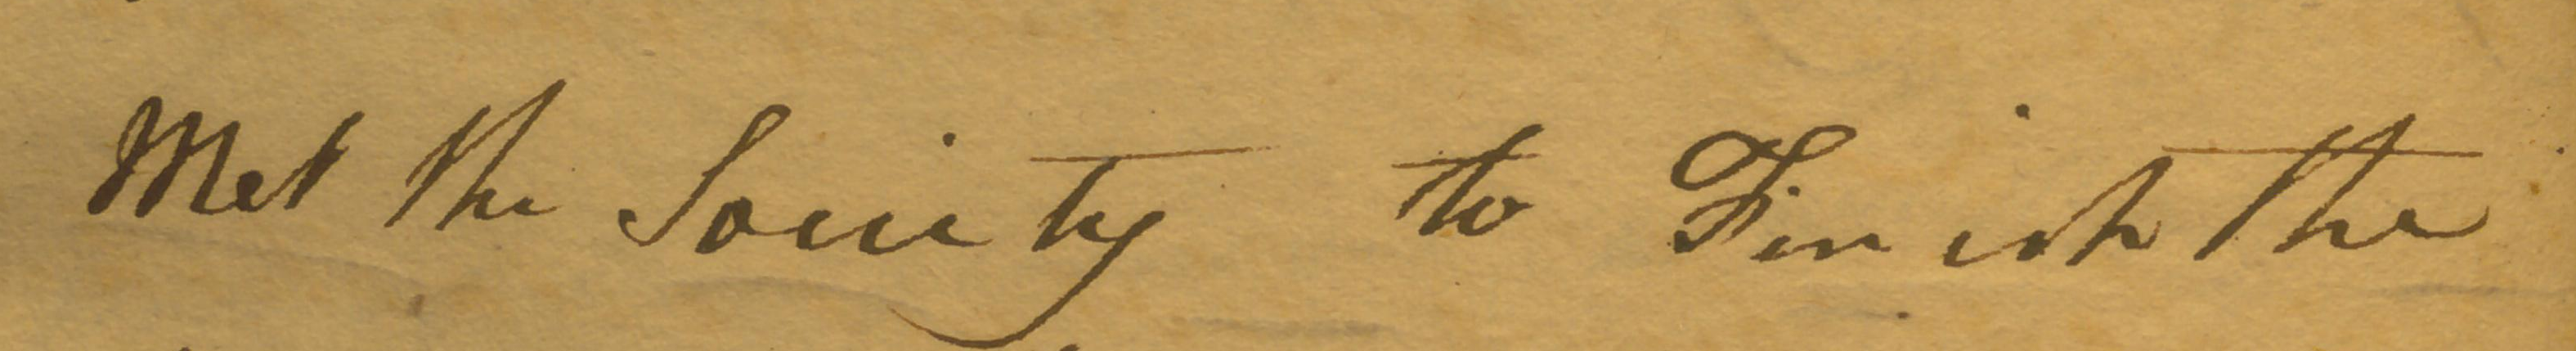Met the Society to Finish the
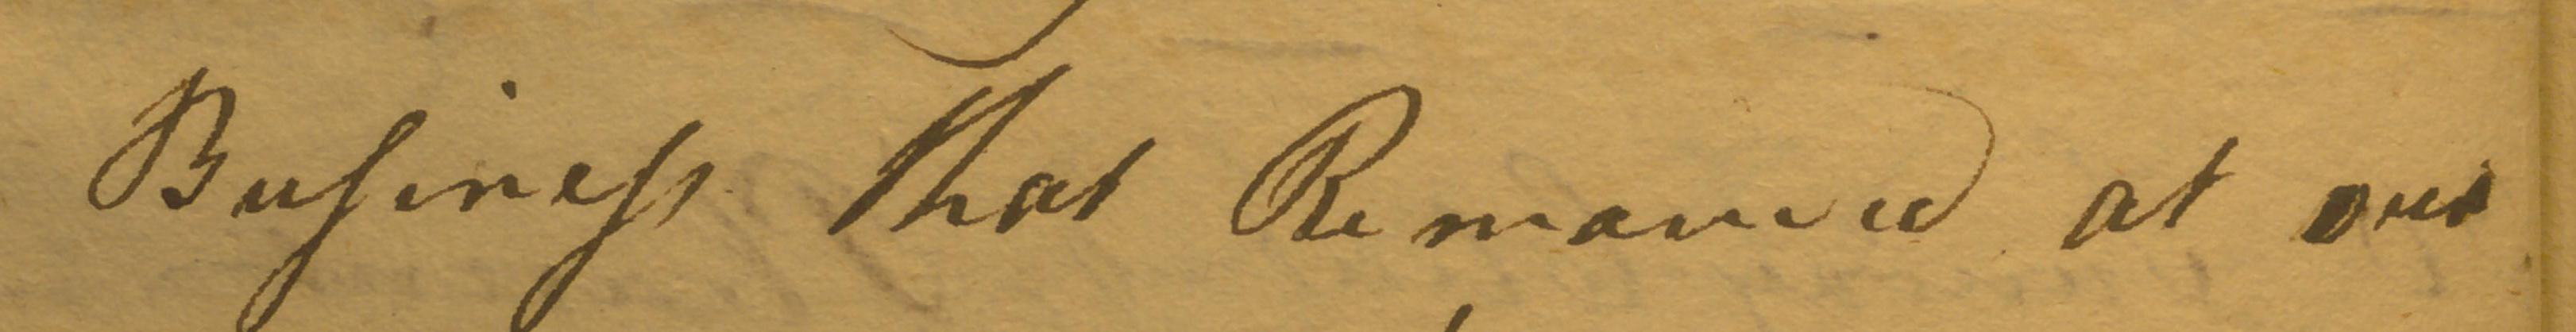Business that Remained at out
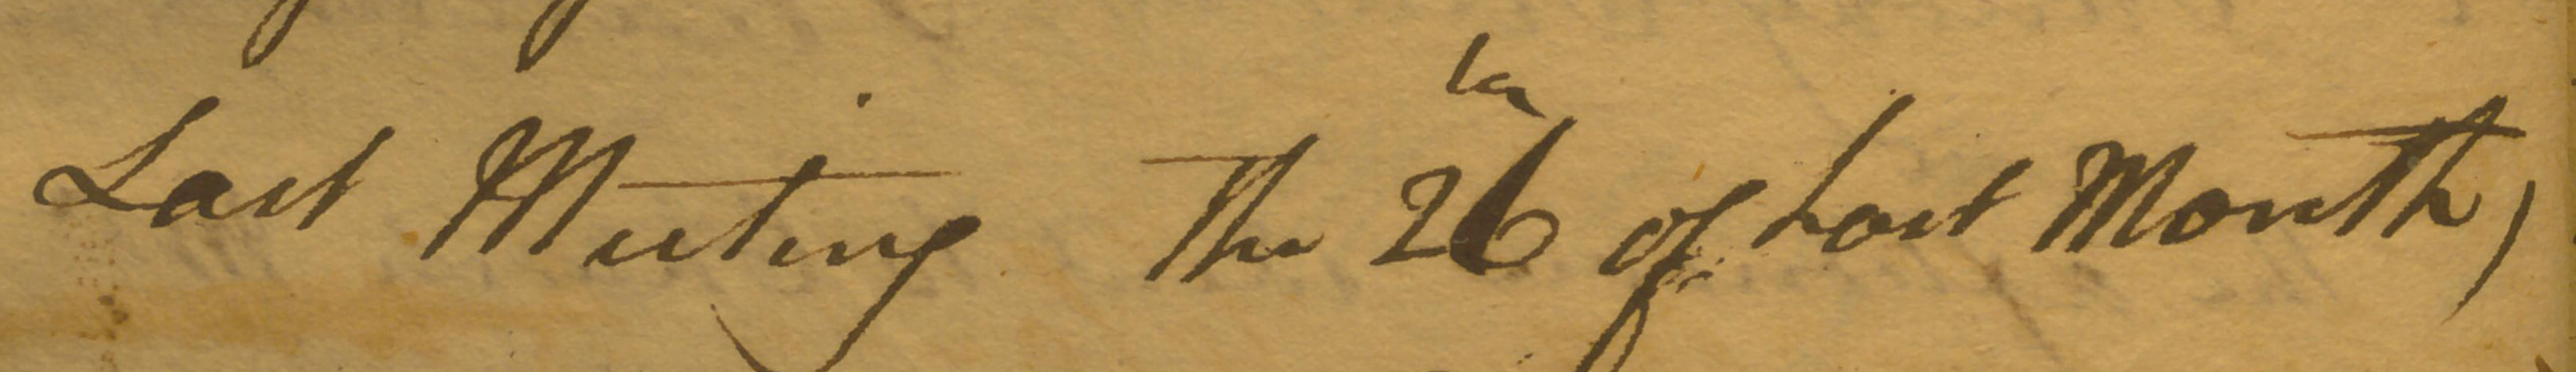Last Meeting the 26^th of Last Month,
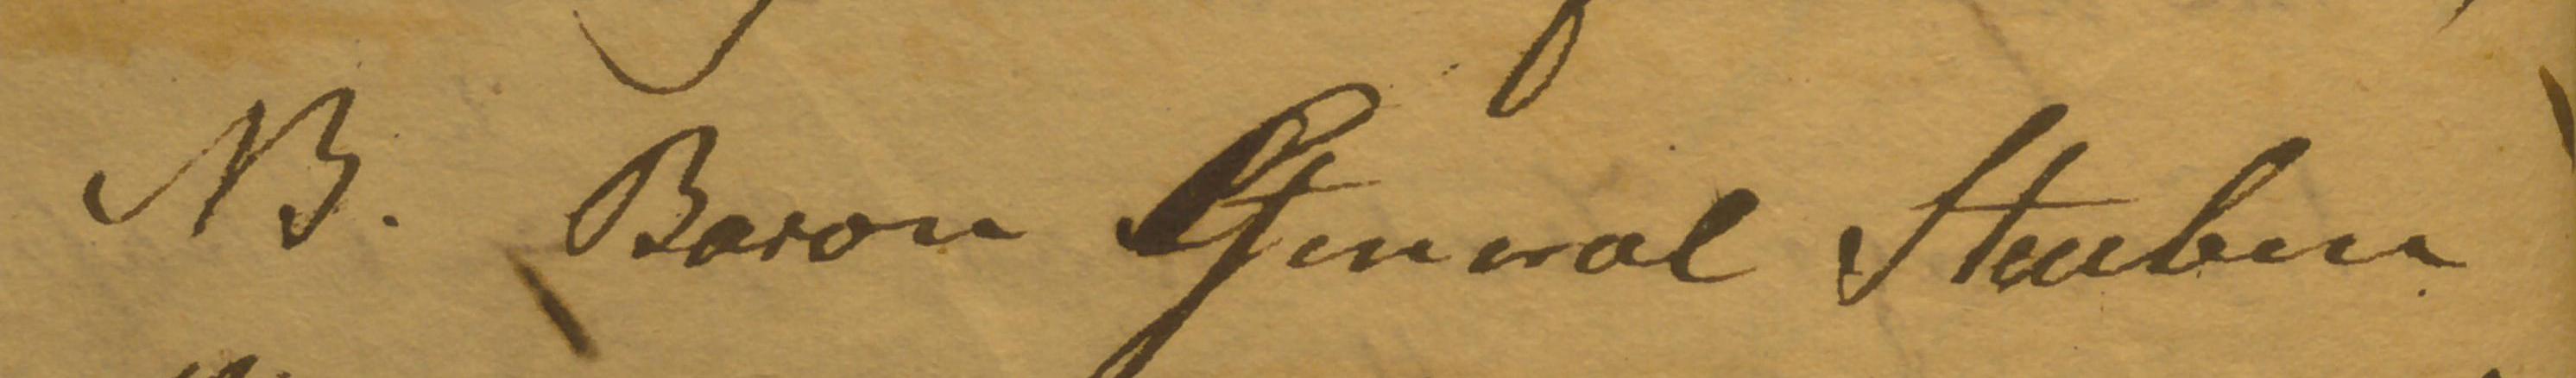NB. Baron General Steueben
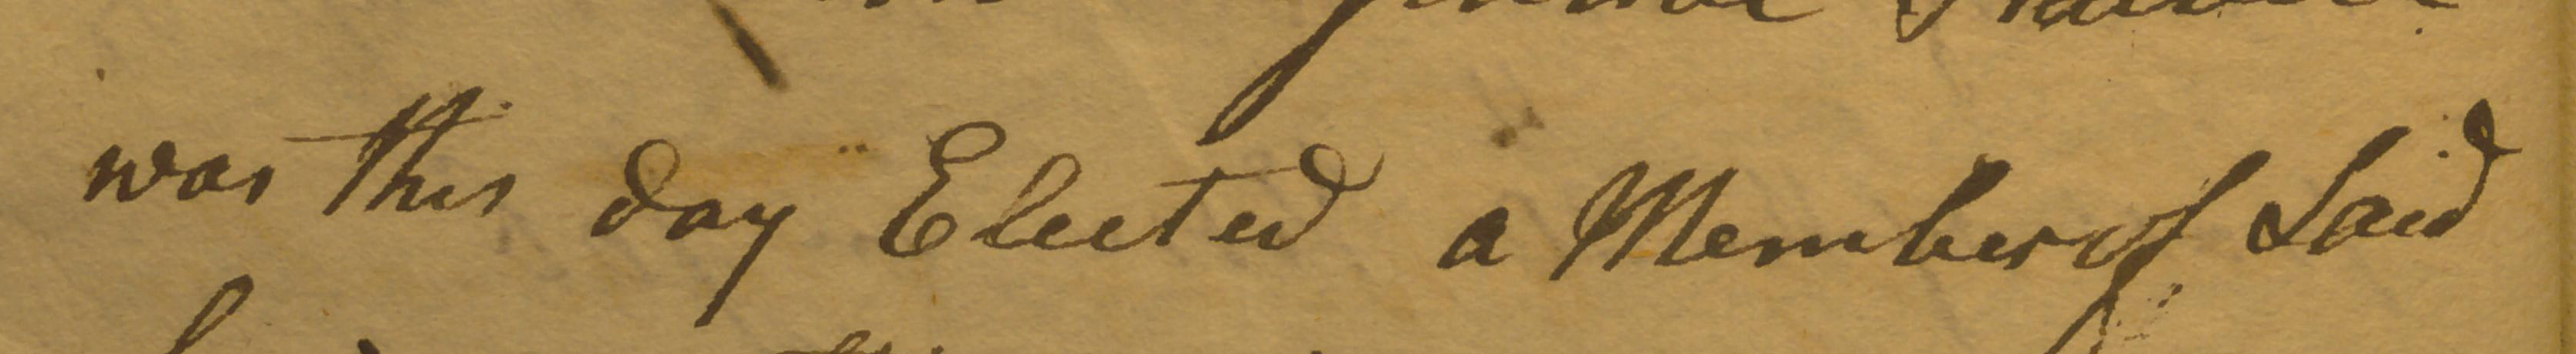was this day Elected a Member of Said
